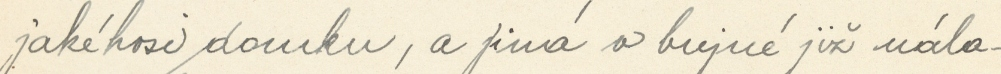jakéhosi domku, a jiná v bujné již nála-
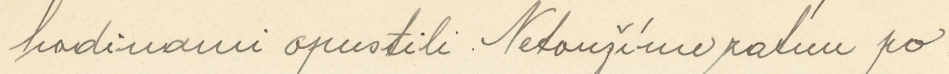hodinami opustili. Netoužíme zatím po
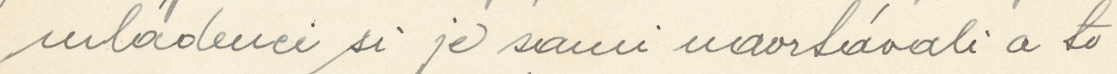mládenci si je sami navrtávali a to
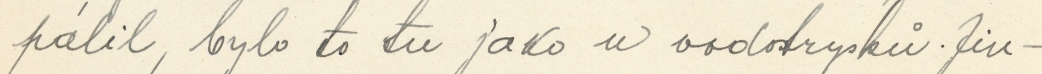pálil, bylo to tu jako u vodotrysků. Jin-
